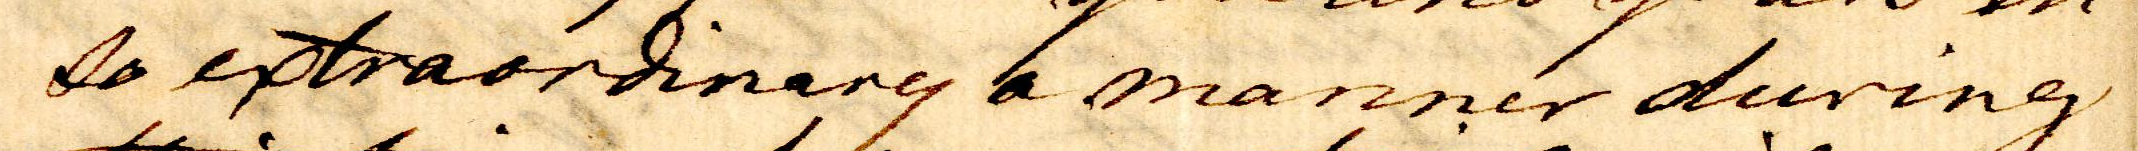so extraordinary a manner during
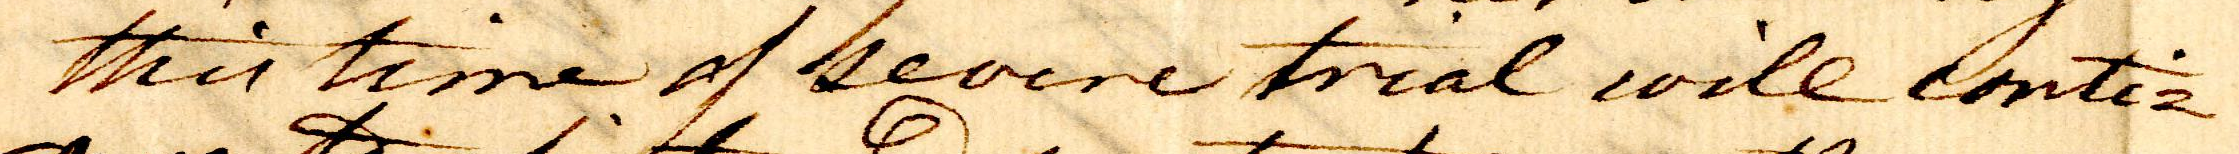this time of severe trial will conti-
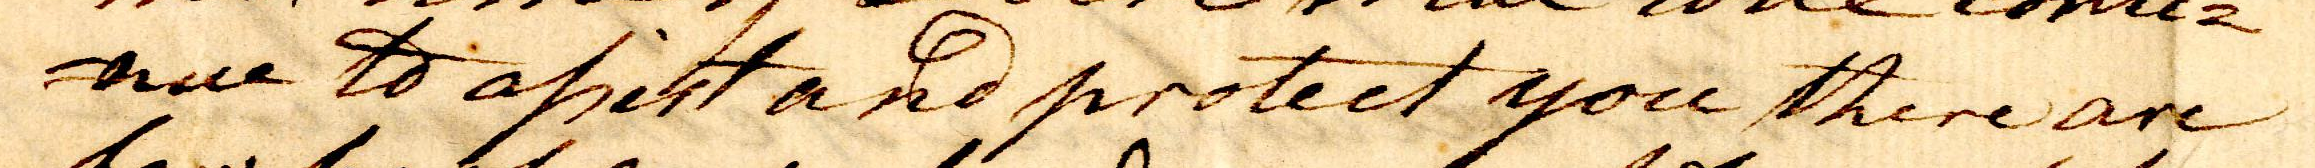-nue to assist and protect you there are
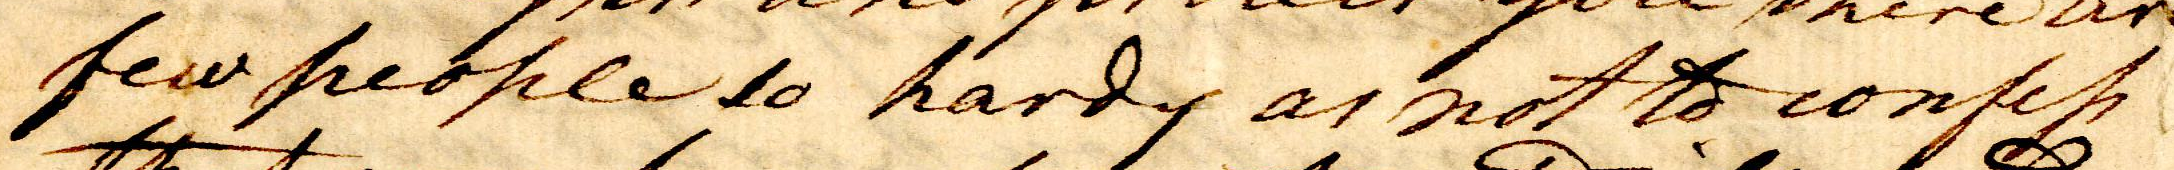few people so hardy as not to confess
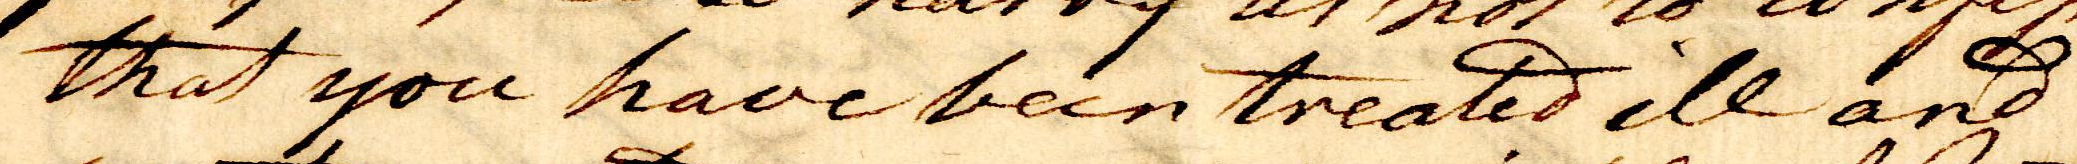that you have been treated ill and
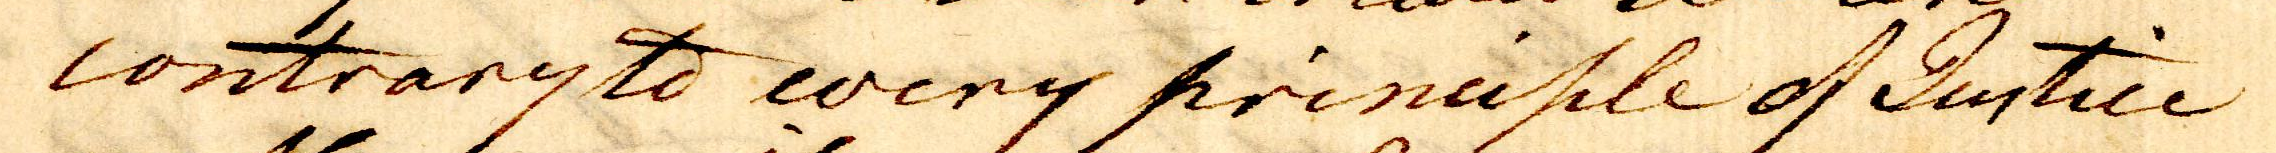contrary to every principle of Justice
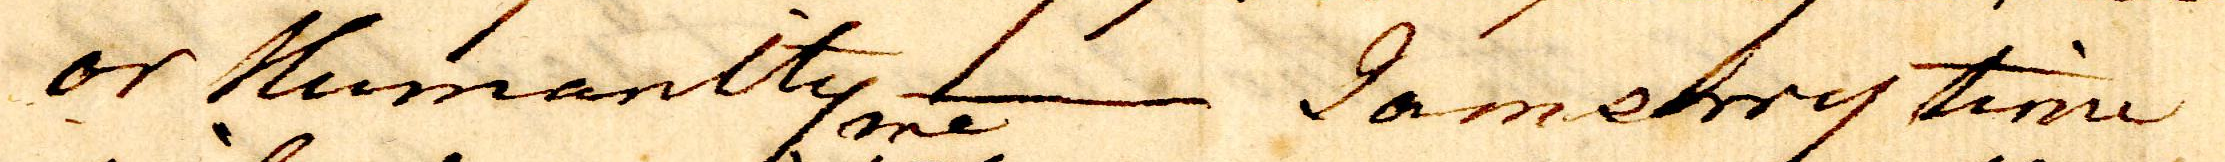or Humanity- I am sorry time
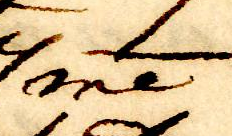me
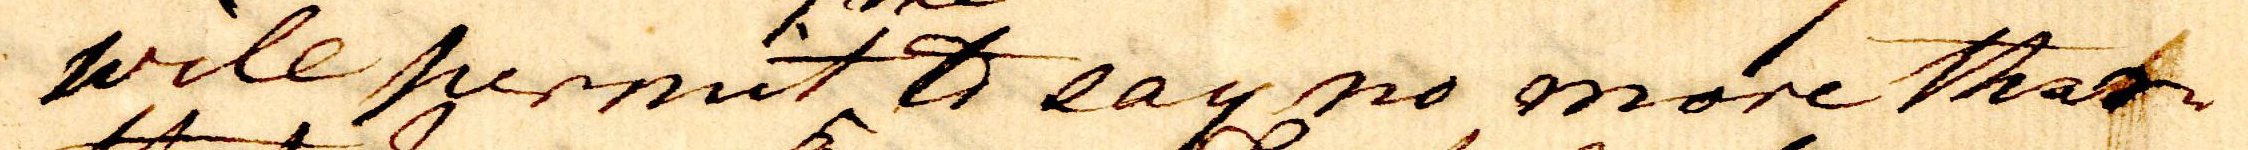will permit ^ to say no more than
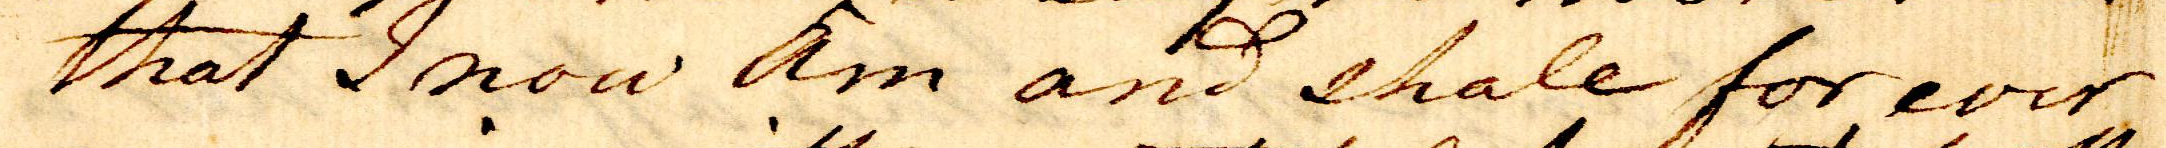that I now am and shall for ever
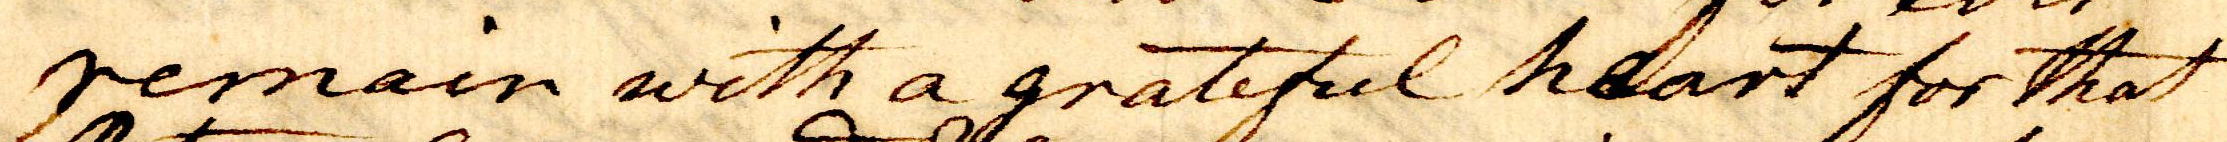remain with a grateful heart for that
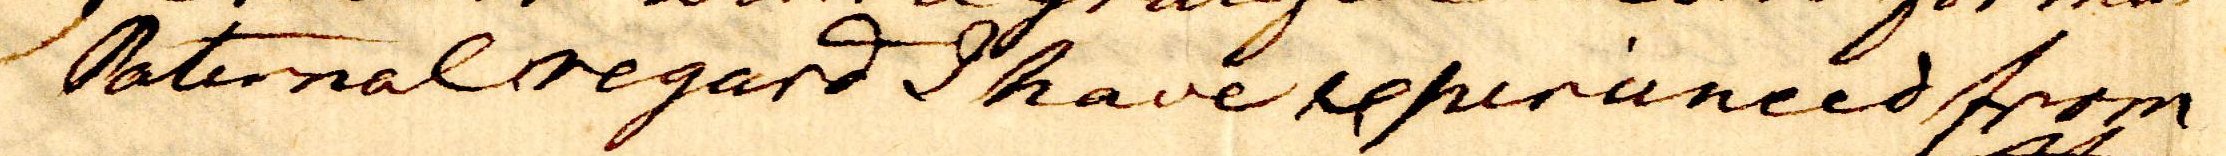Paternal regard I have experienced from
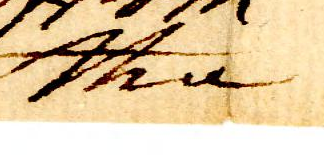thee
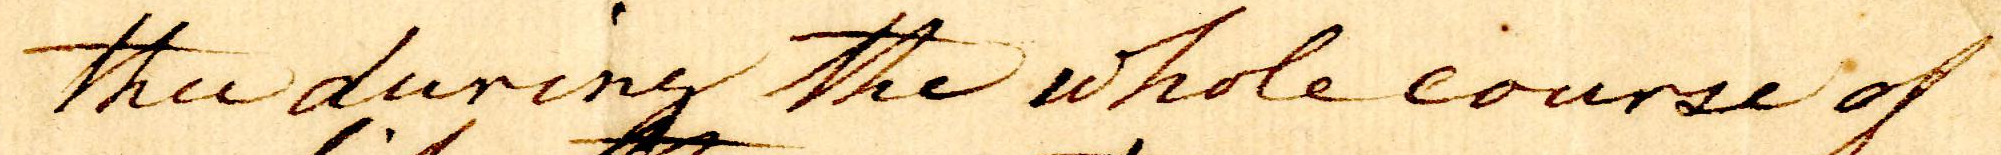thee during the whole course of
